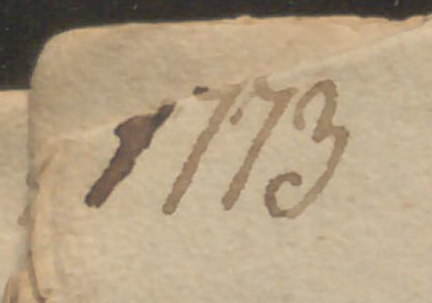1773
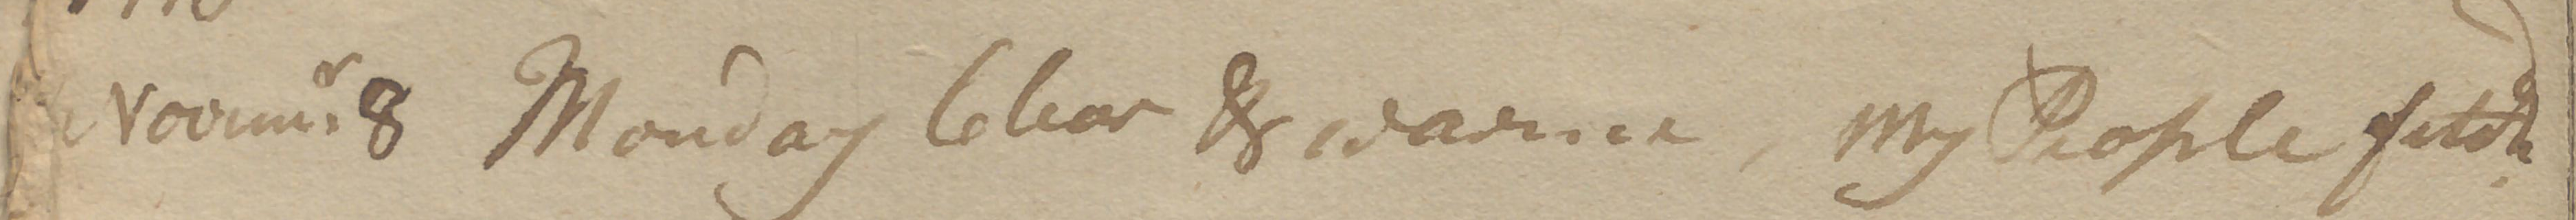Novem^r. 8 Monday Clear & warm, My People fetchd.
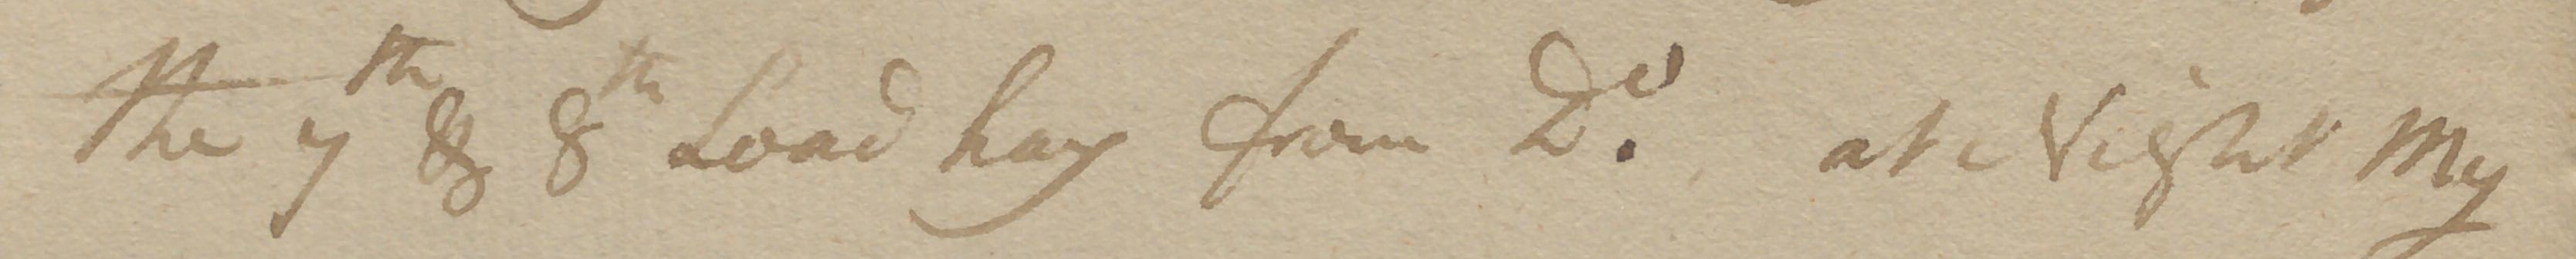the 7^th & 8^th Load hay from D^o. at Night My
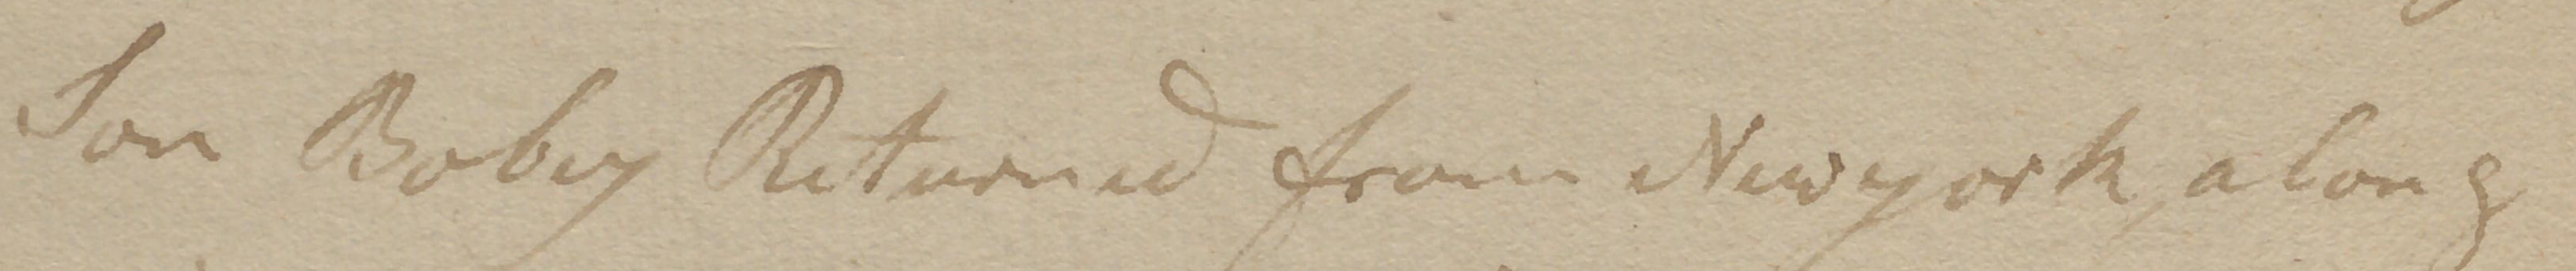Son Bobey Returned from Newyork along
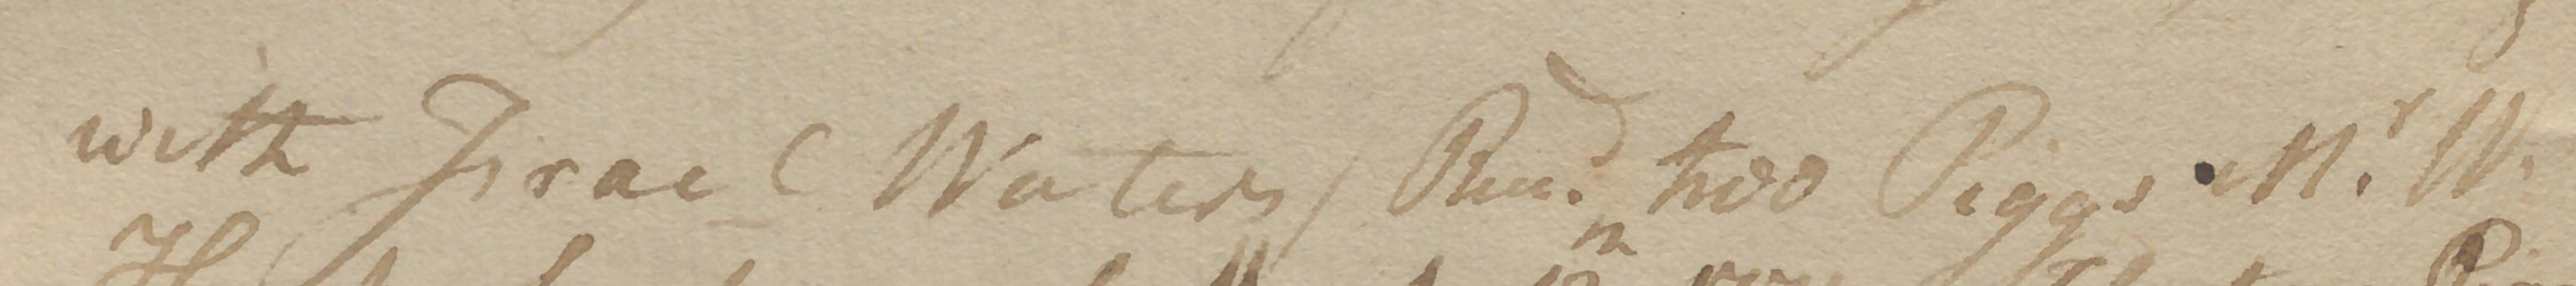with Israel Waters, Rece^d. two Piggs M^r. W
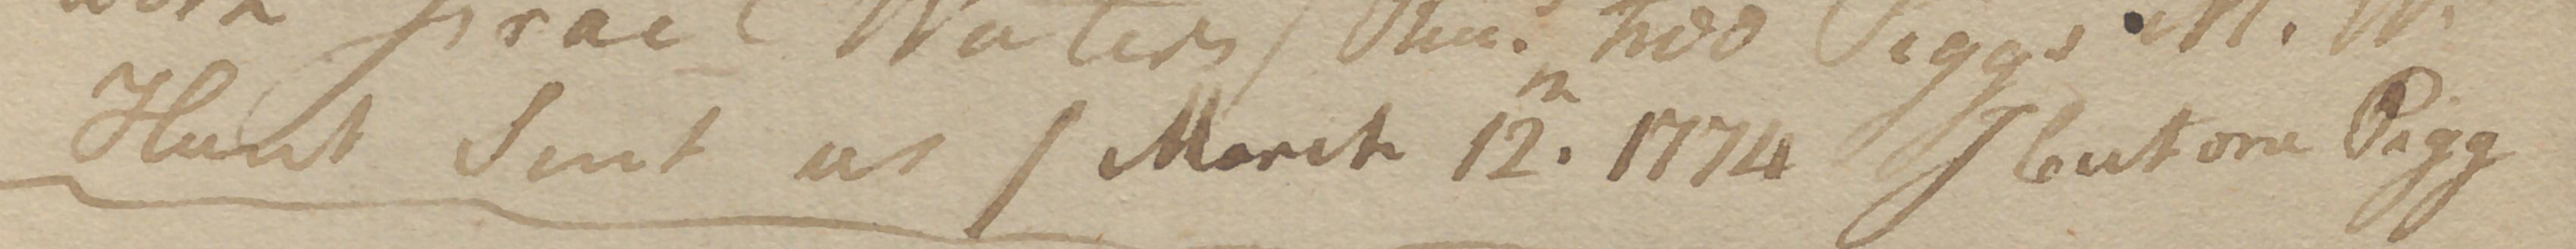Hunt sent us / March 12^th. 1774 Cut one Pigg
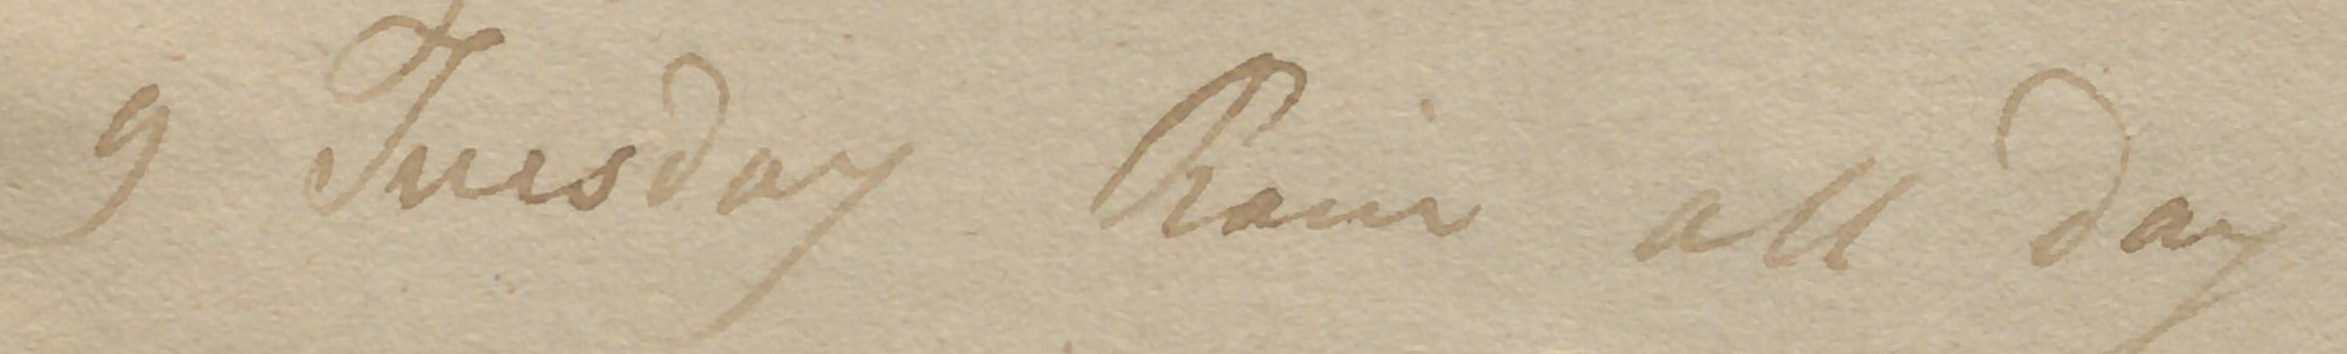9 Tuesday Rain all day
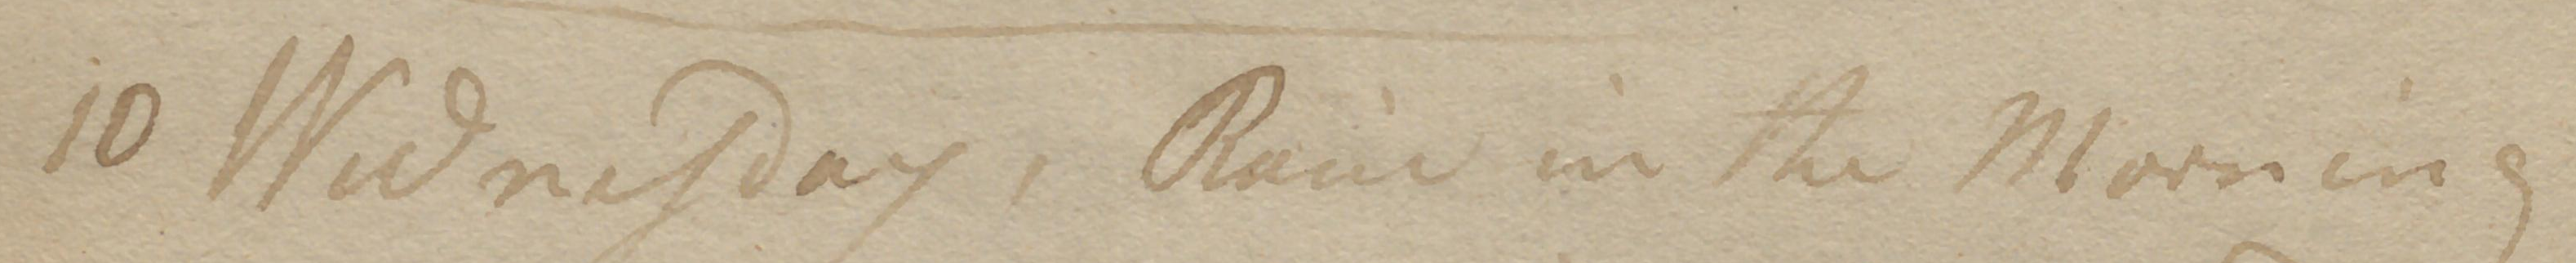10 Wednesday, Rain in the Morning
